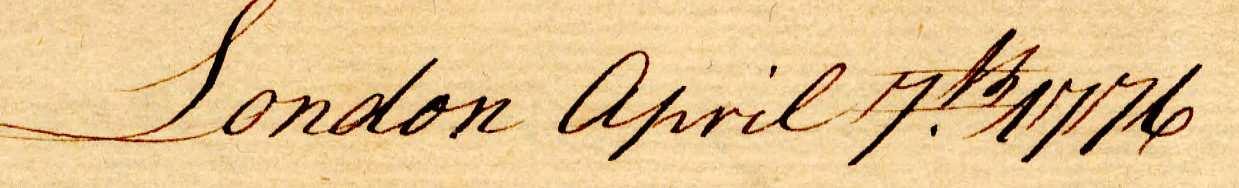London April 7^th. 1776
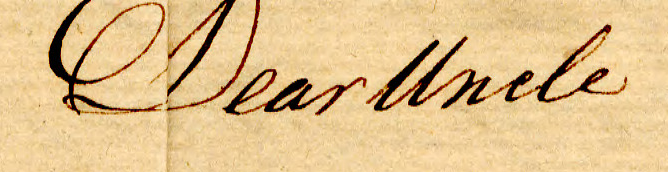Dear Uncle
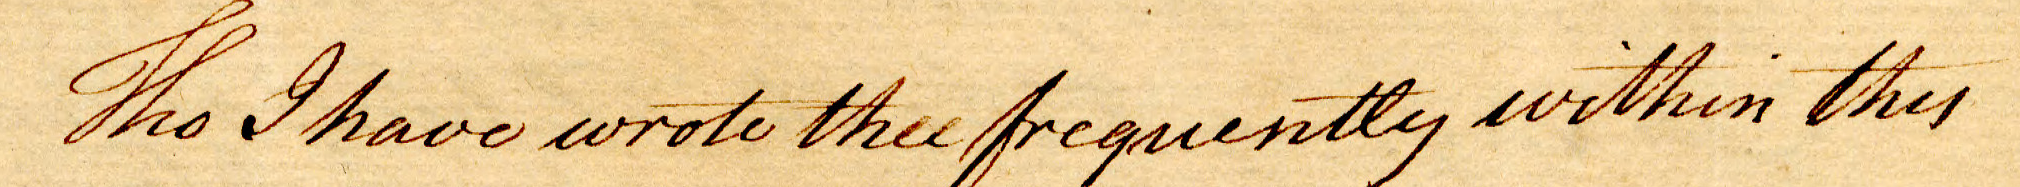Tho I have wrote thee frequently within this
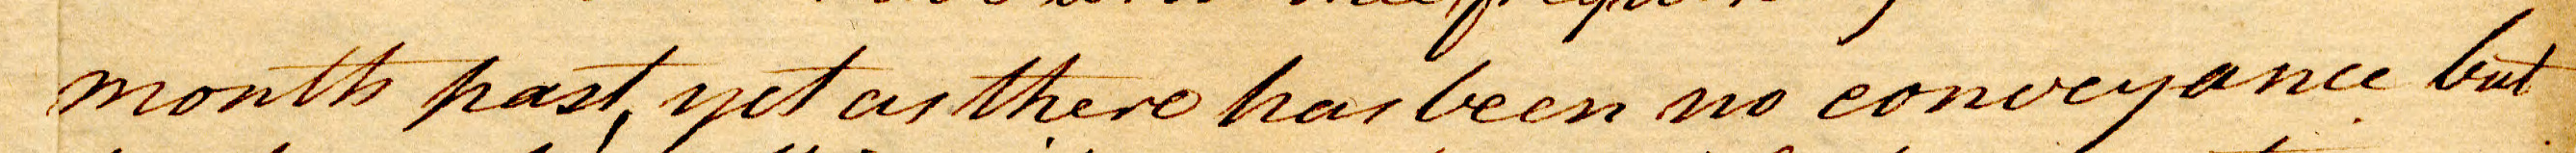month past, yet as there has been no conveyance but
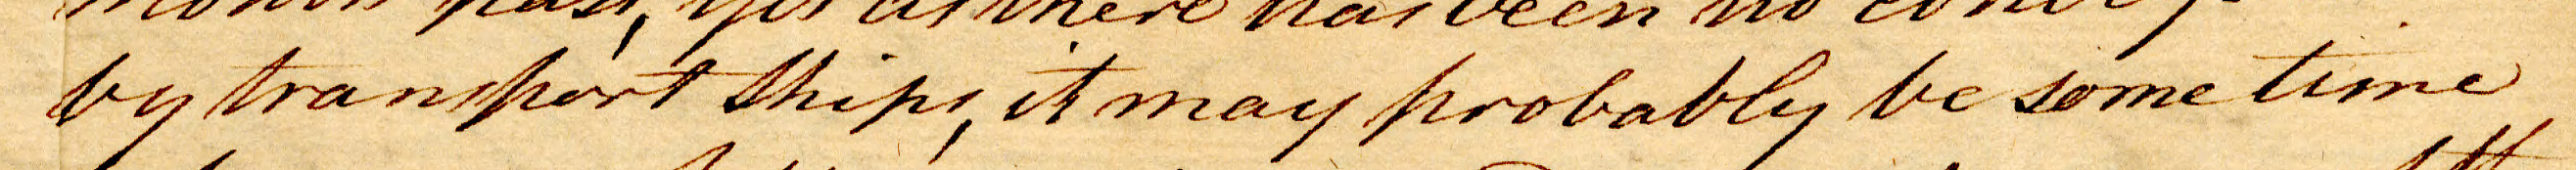by transport ships, it may probably be some time
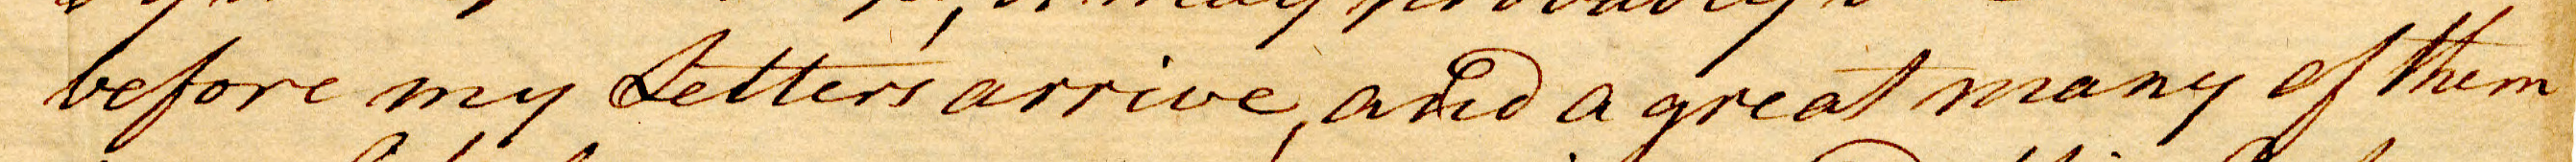before my Letters arrive, and a great many of them
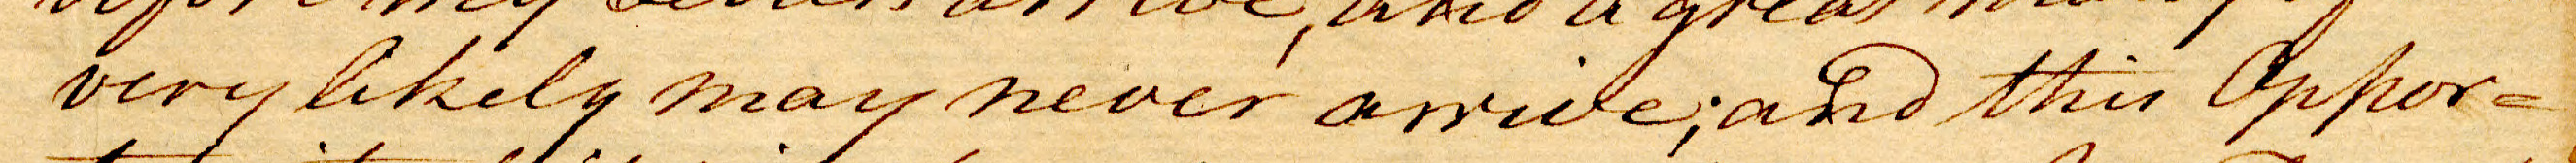very likely may never arrive; and this Oppor-
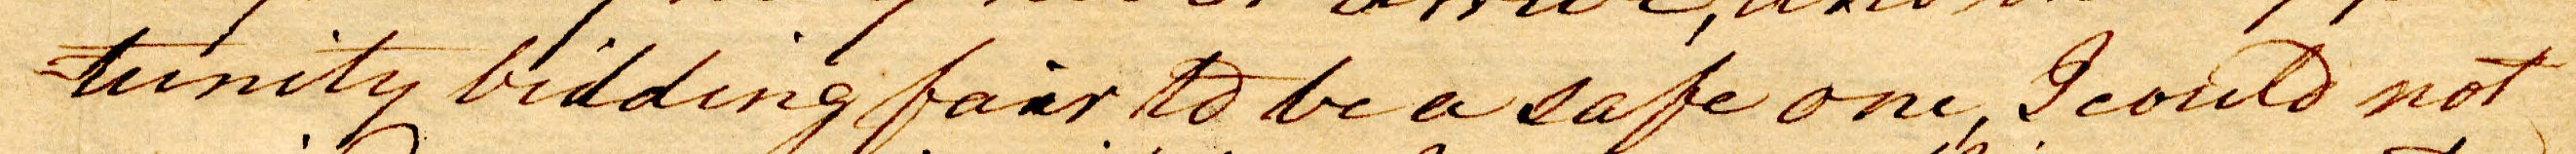-tunity bidding fair to be a safe one, I could not
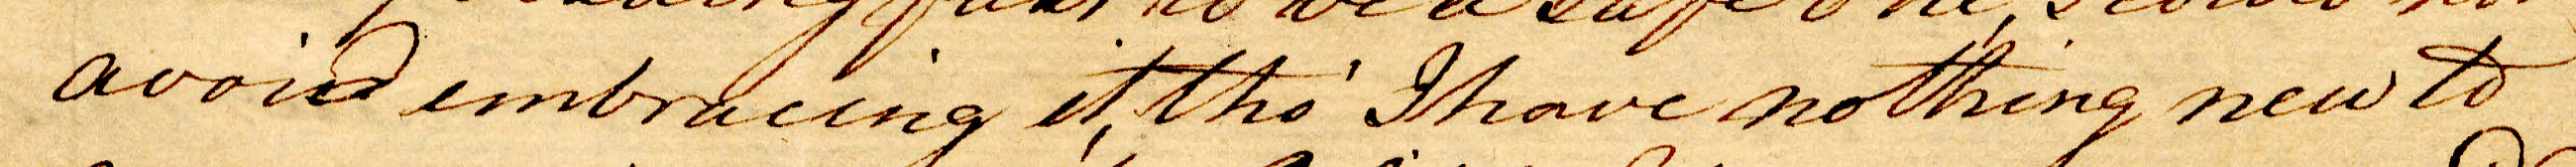avoid embracing it, tho' I have nothing new to
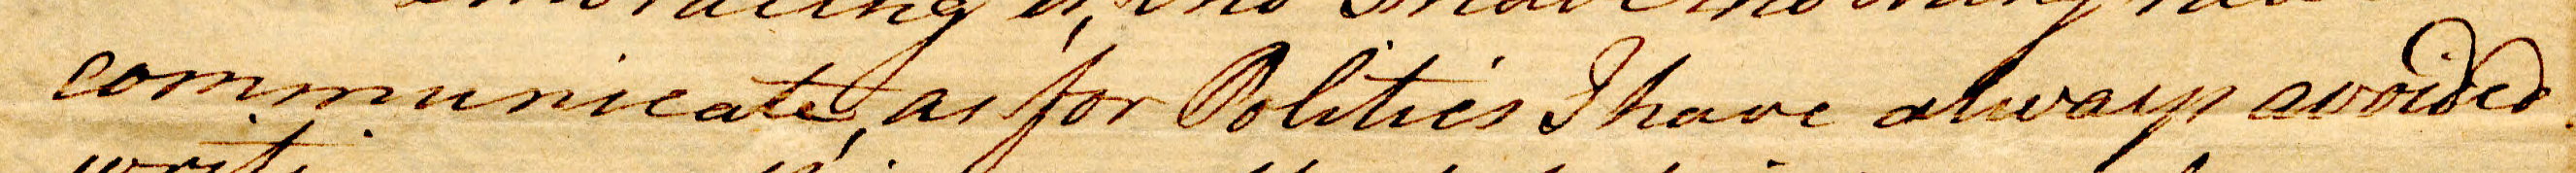communicate, as for Politics I have always avoided
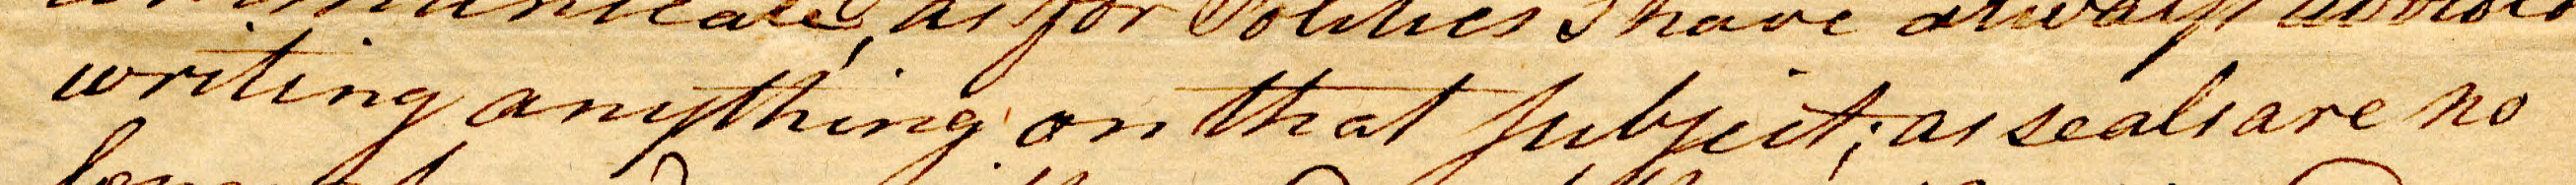writing anything on that subject; as seals are no
